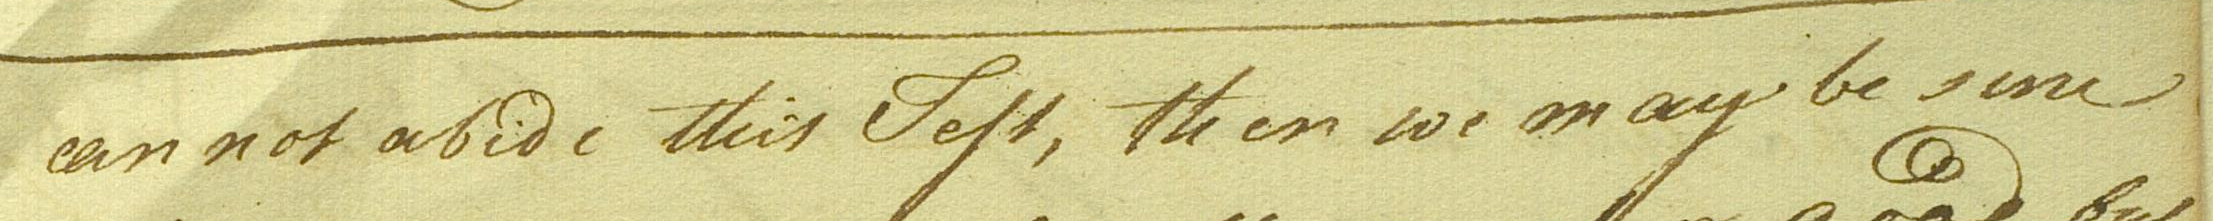can not abide this Test, then we may be sure
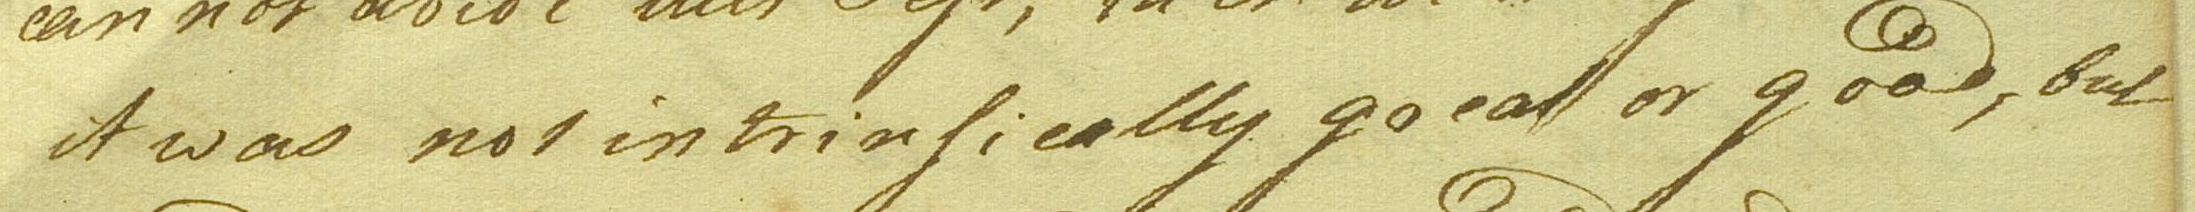it was not intrinsically great or good, but
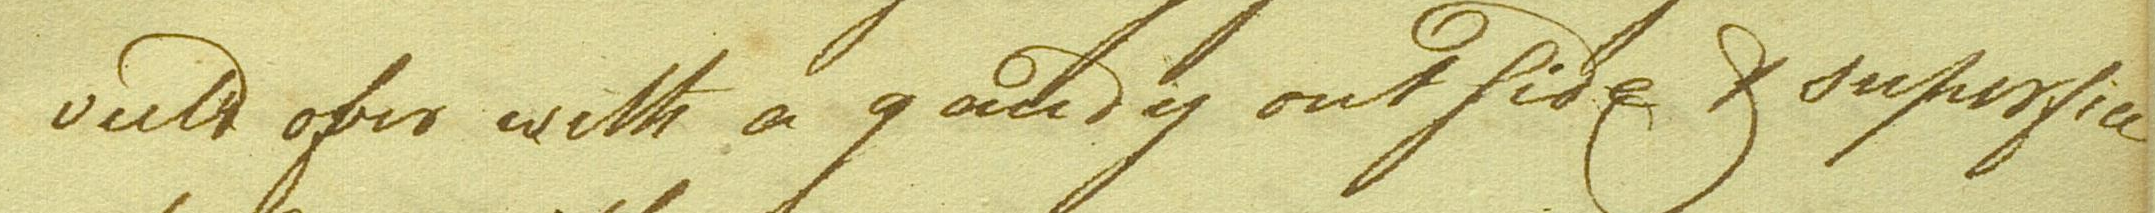veil'd over with a gaudy outside & superfici
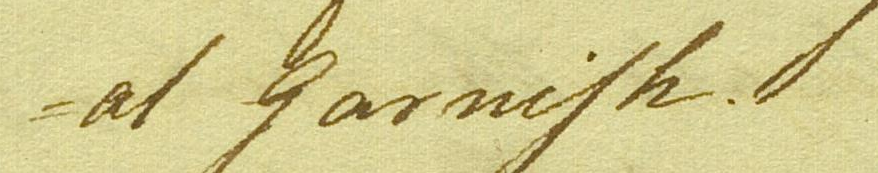-al garnish.
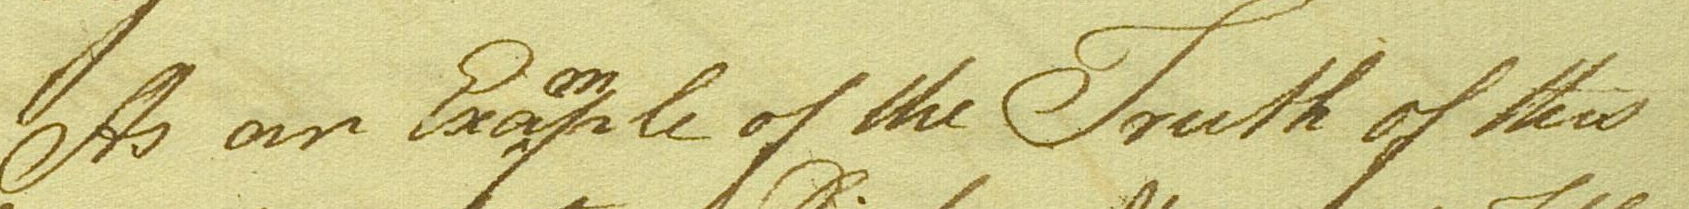As our Exa^mple of the Truth of this
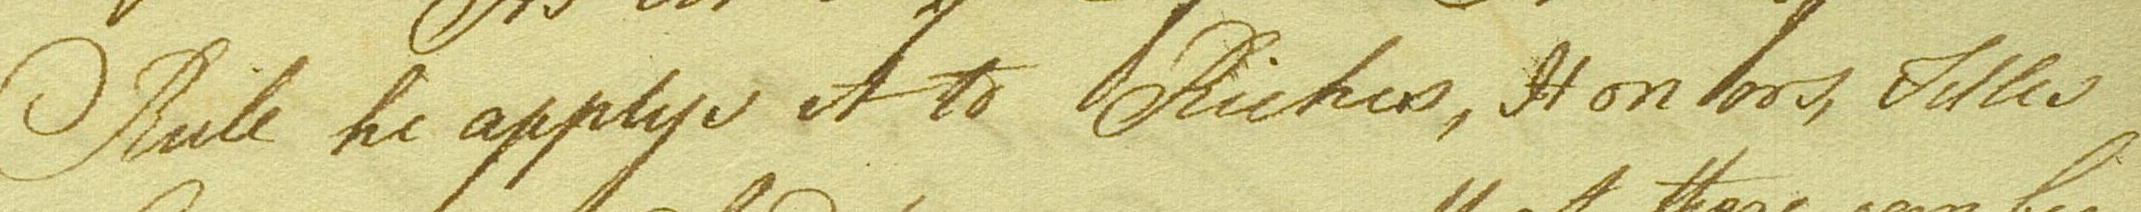Rule he applys it to Riches, Honors, Julles
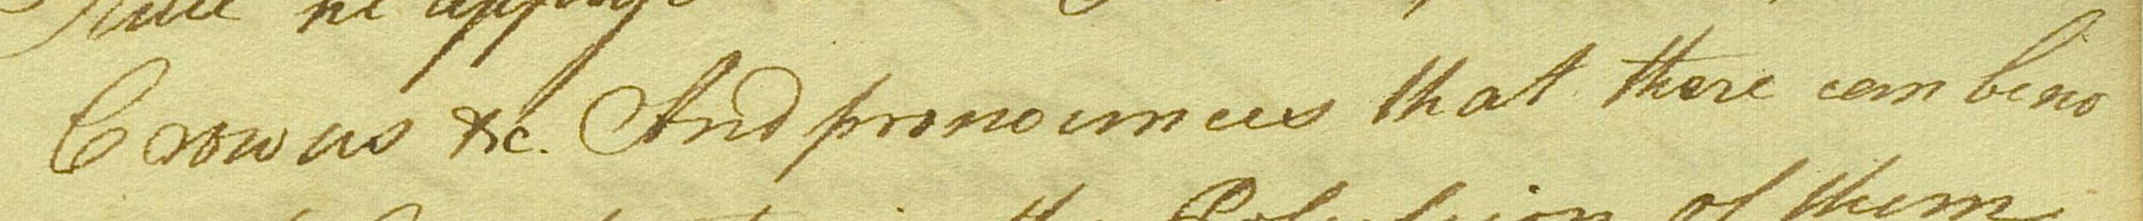Crowns &c. And pronounces that there can be no
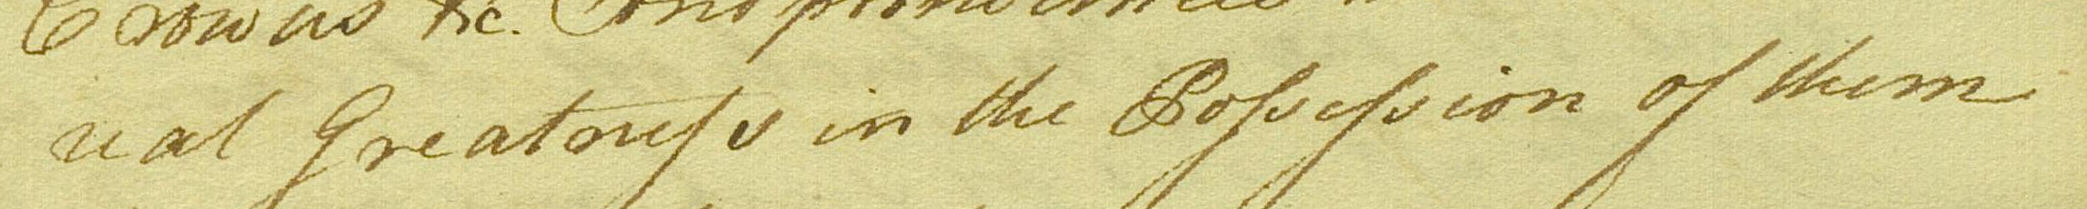real Greatness in the Possession of them
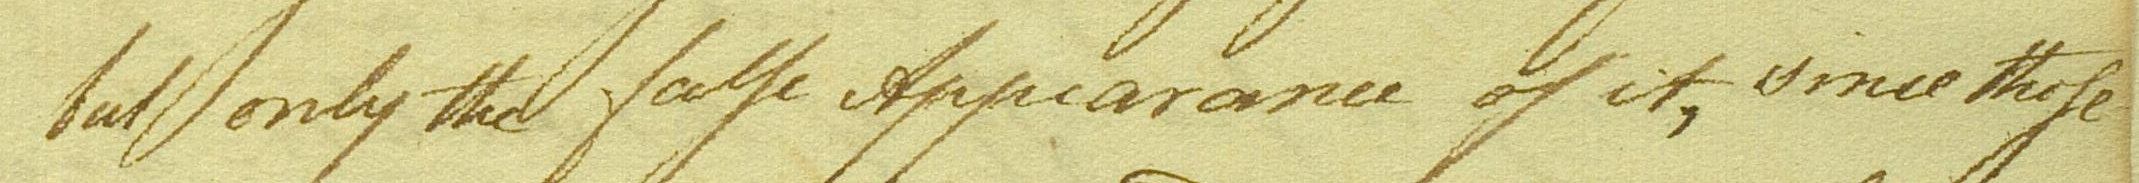but only the false Appearance of it, since those
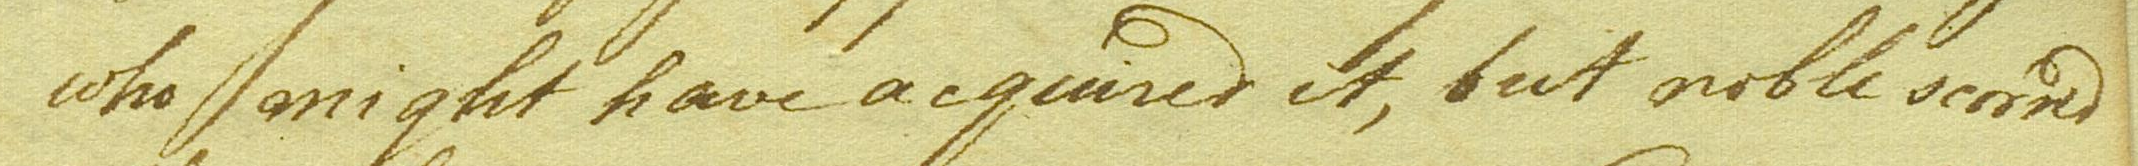who might have acquired it, but noble sens'd
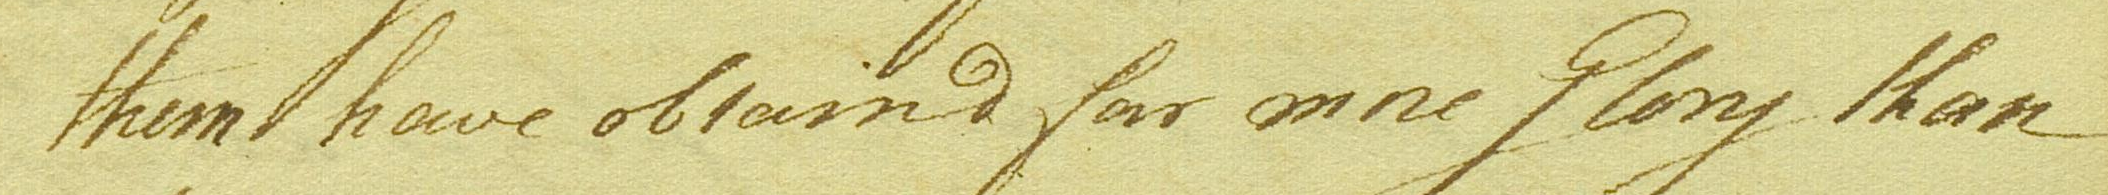them have obtaind far more Glory than
